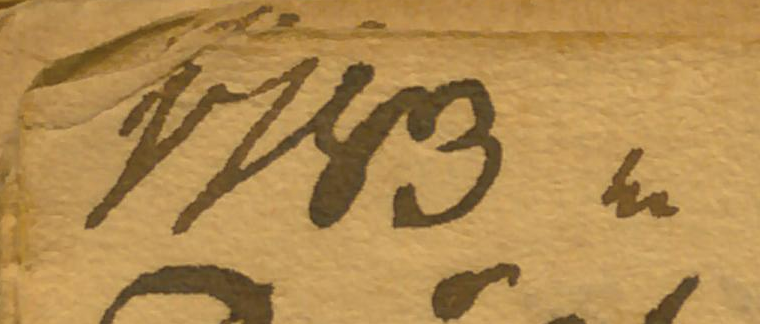1783
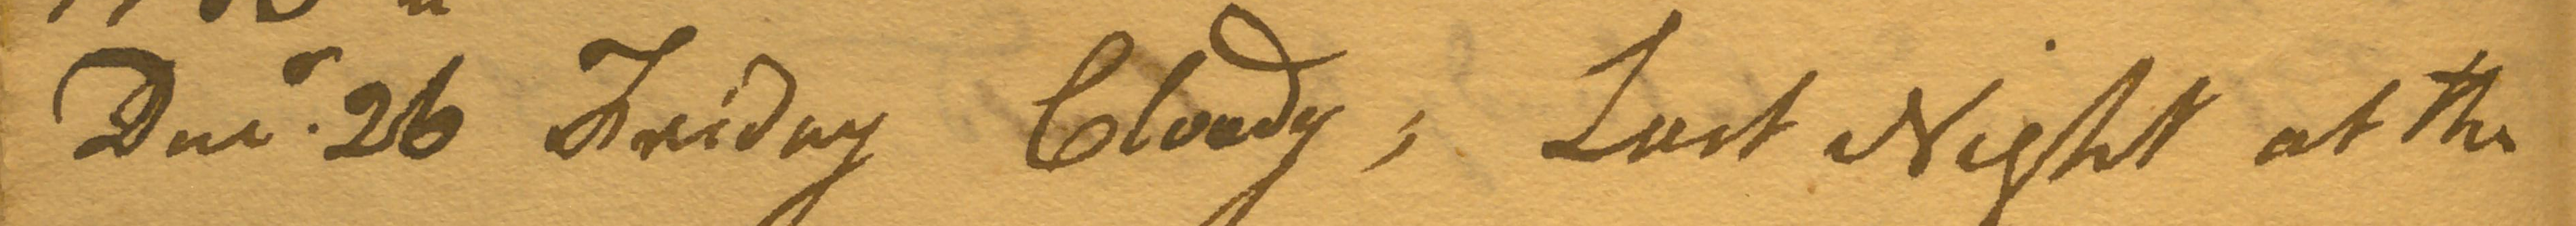Dec^r. 26^th Friday Cloudy, Last Night at the
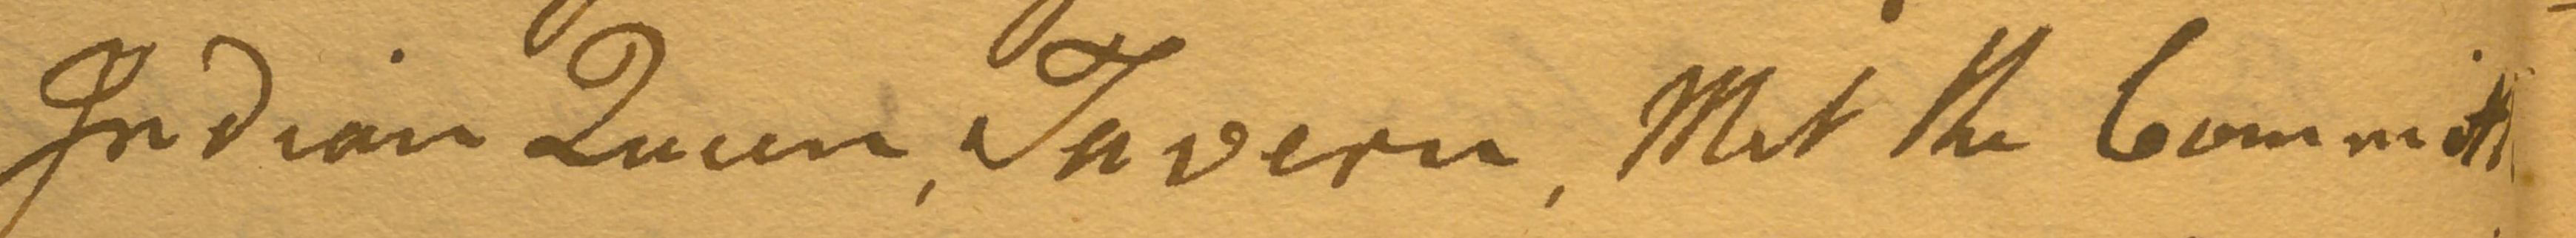Indian Queen Tavern, Met the Committ
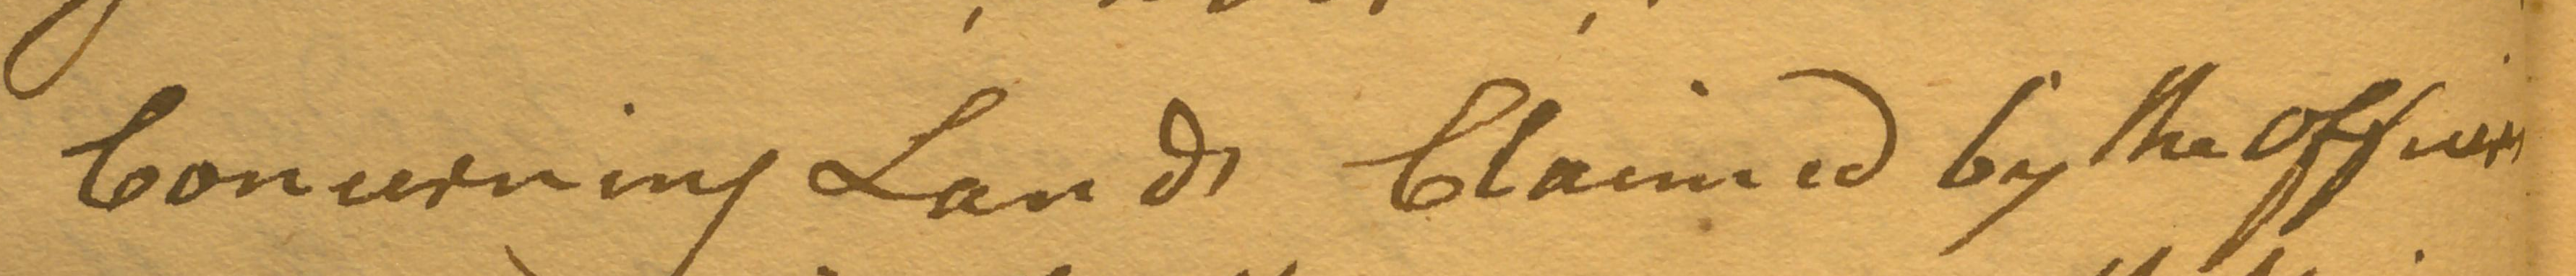Concerning Lands Claimed by the Officers
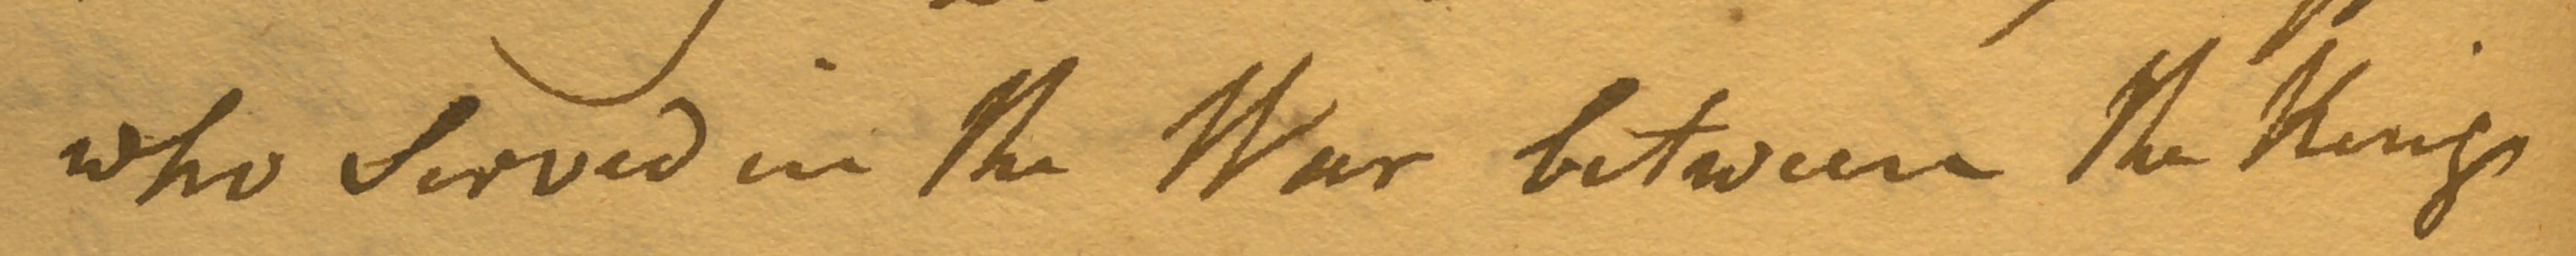who served in the War between the Kings
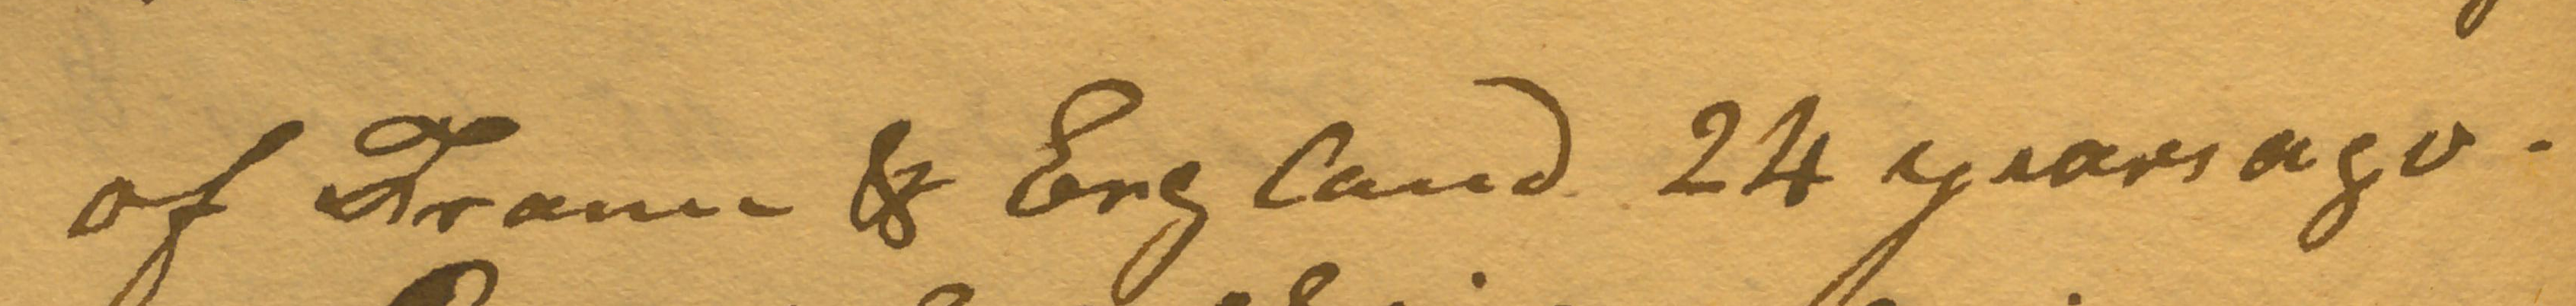of France & England 24 years ago
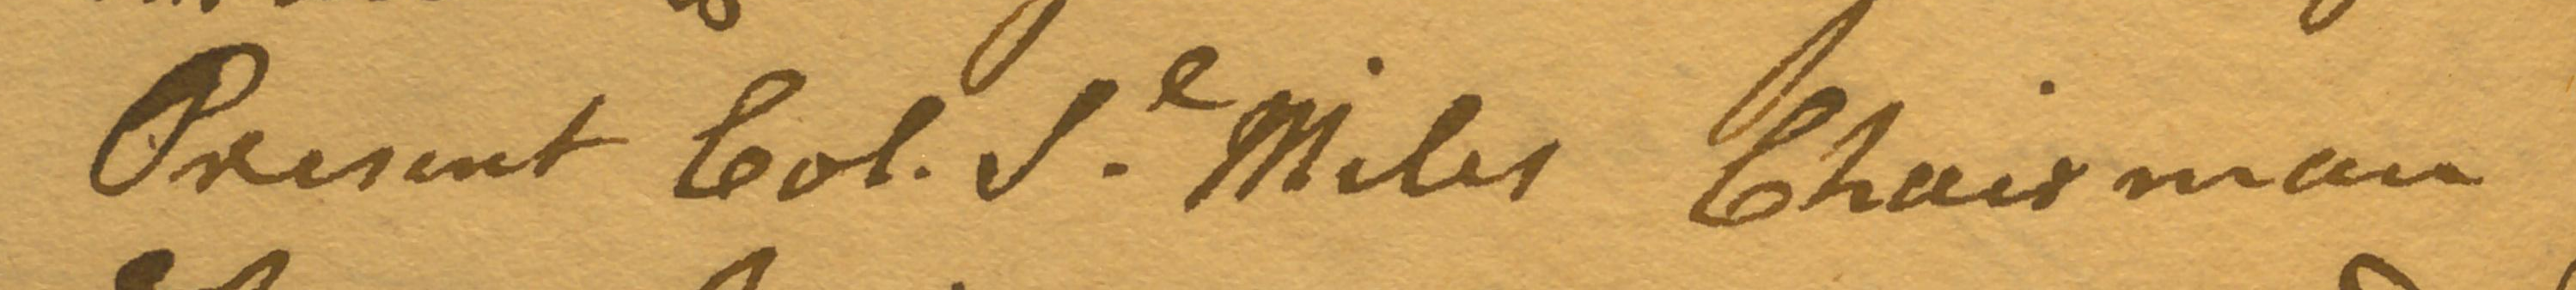Present Col. S^l. Miles Chairman
